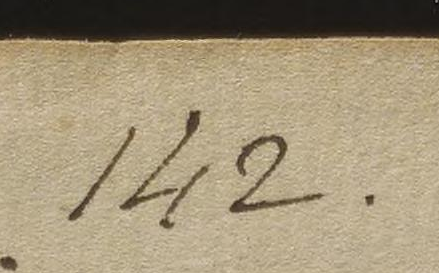142
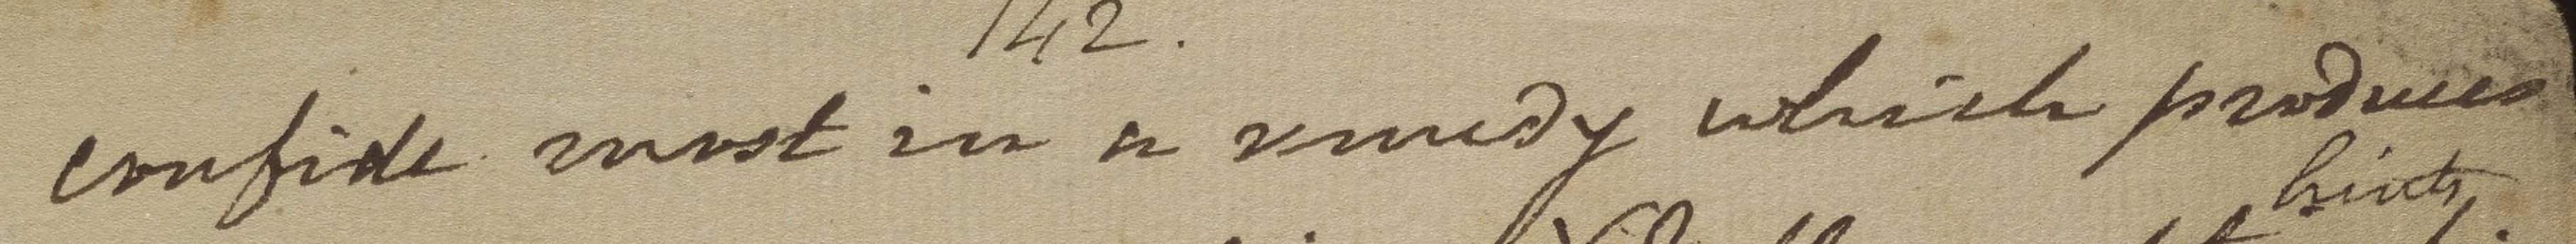confide most in a remedy which produces
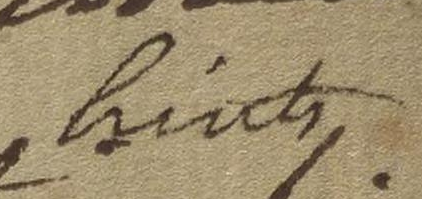hints
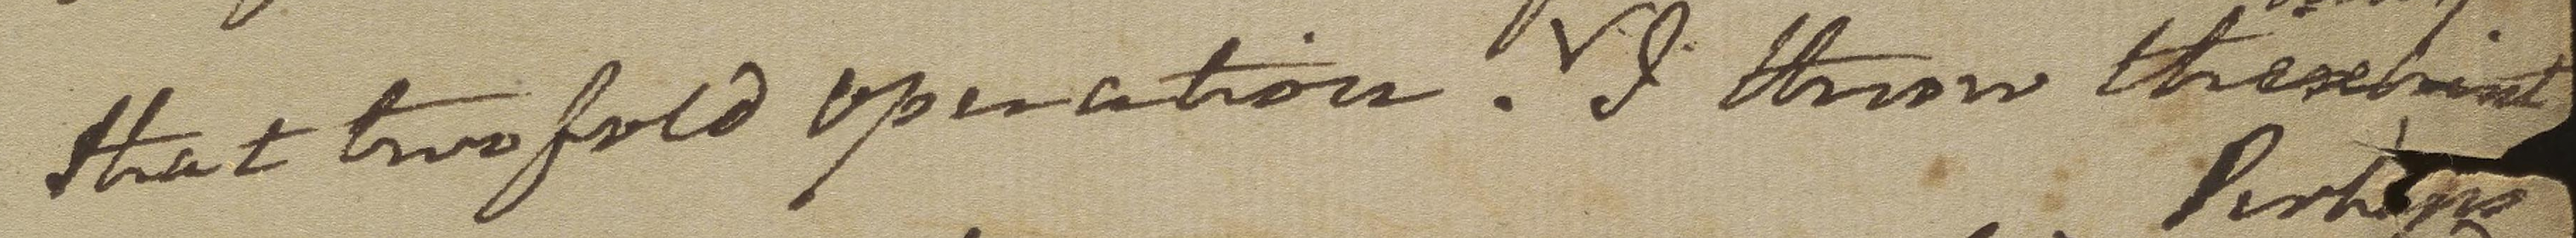that twofold operation. V I throw [these hint]
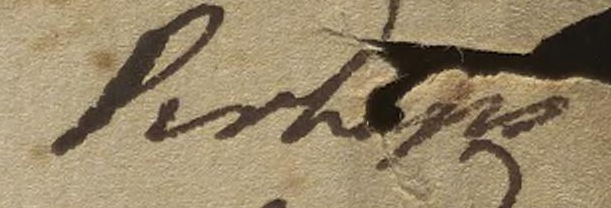Perhaps
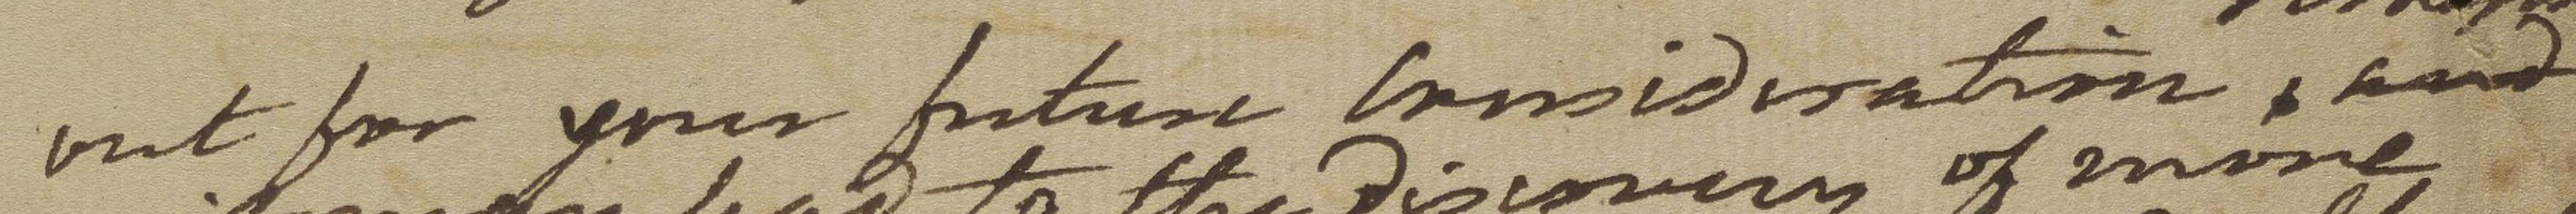out for your future consideration. [and]
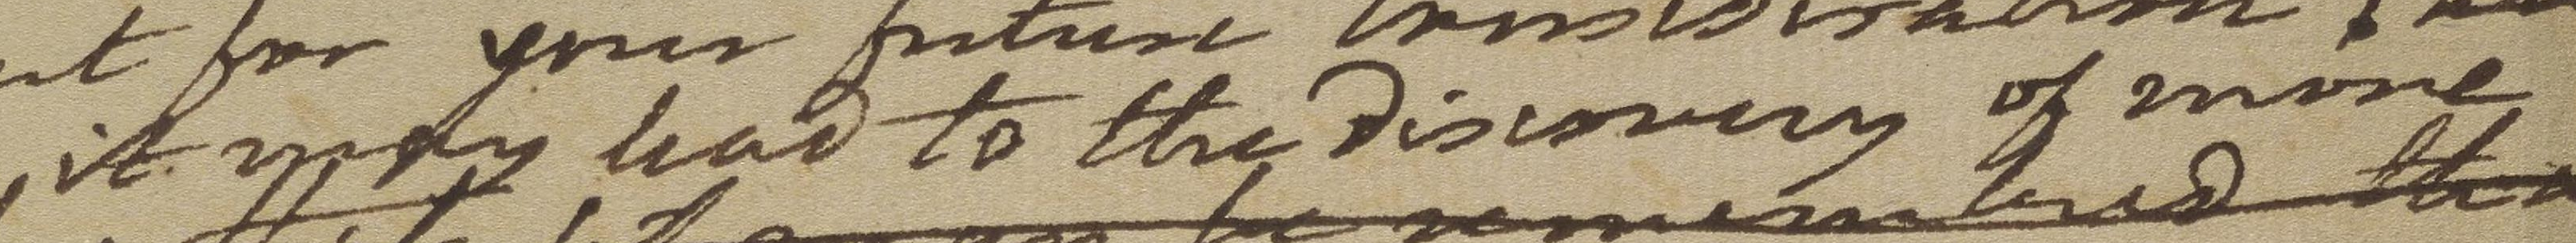it may lead to the discovery of more
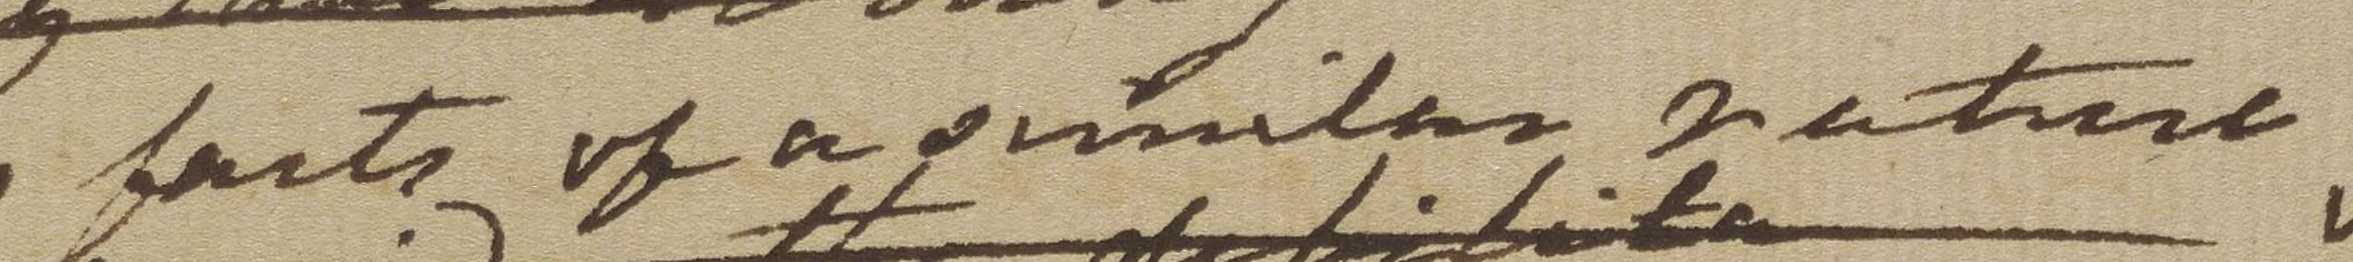facts of a similar nature
